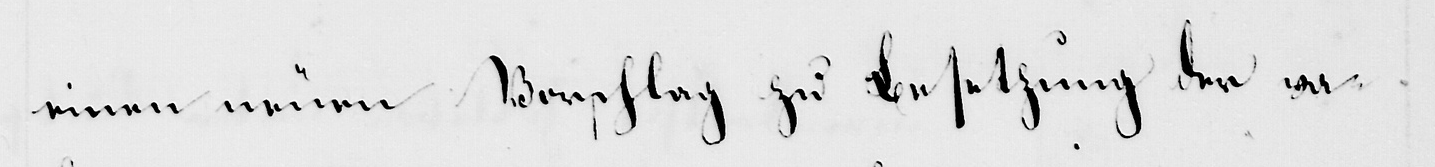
einen neuen Vorschlag zu Besetzung der va¬
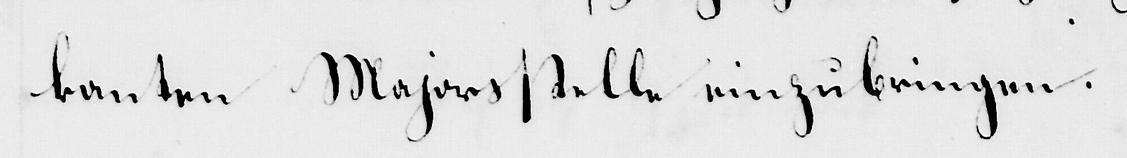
kanten Majorsstelle einzubringen.
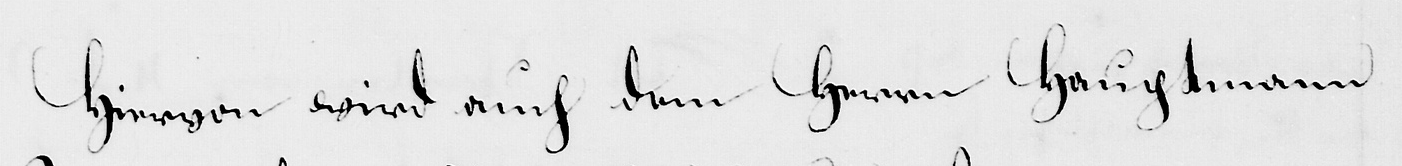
Hiervon wird auch dem Herrn Hauptmann
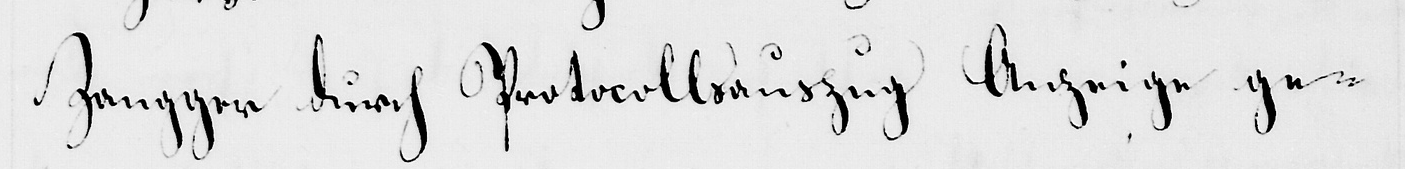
Zangger durch Protocollsauszug Anzeige ge¬
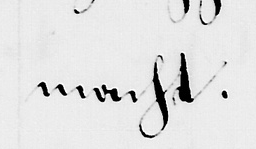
macht.
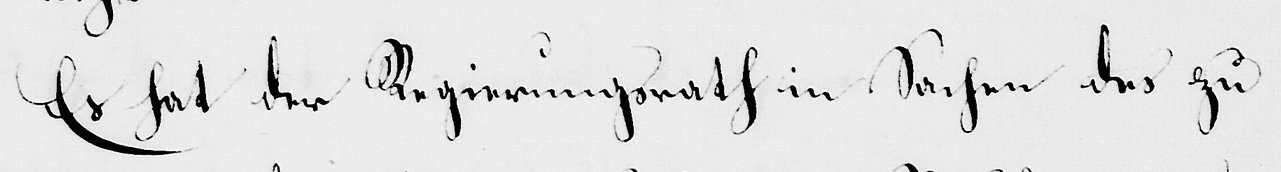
Es hat der Regierungsrath in Sachen des zu
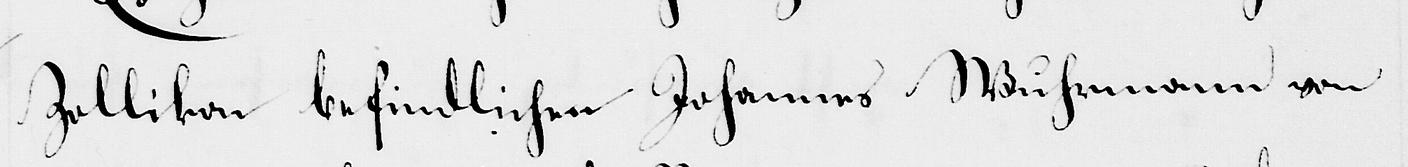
Zollikon befindlichen Johannes Wuhrmann von
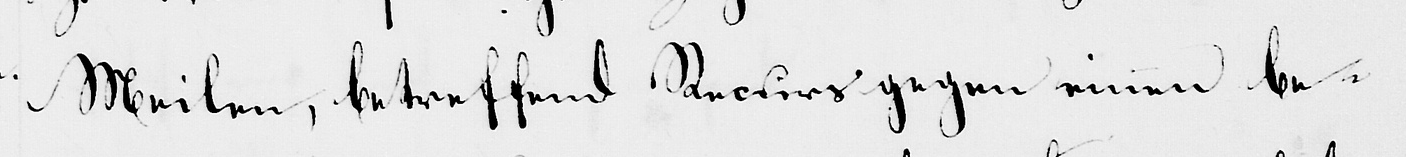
Meilen, betreffend Recurs gegen einen be¬
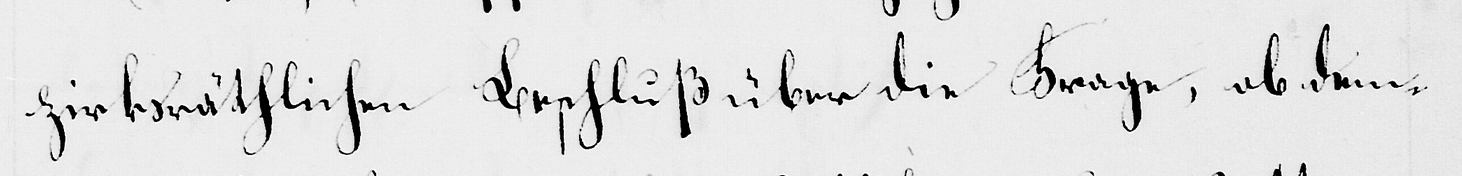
zirksräthlichen Beschluß über die Frage, ob dem¬
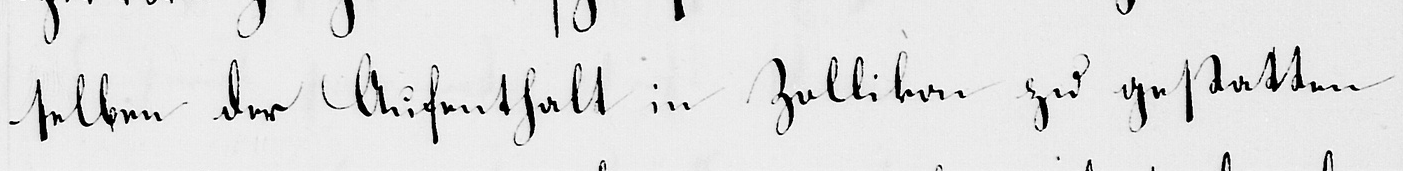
selben der Aufenthalt in Zollikon zu gestatten
